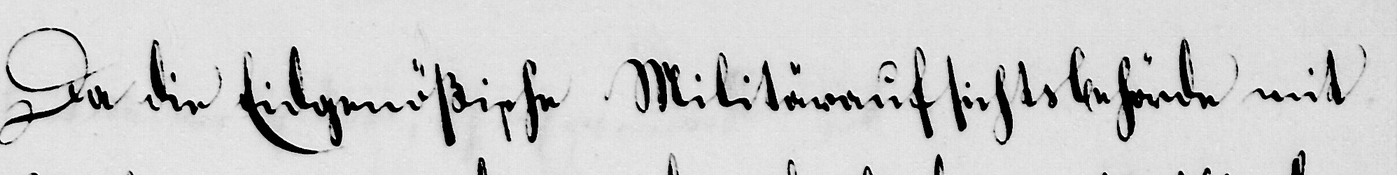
Da die Eidgenößische Militäraufsichtsbehörde mit
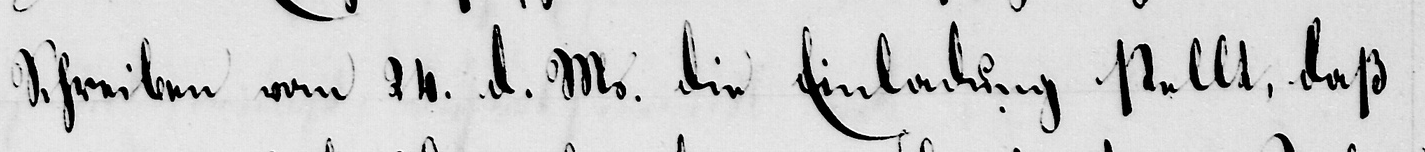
Schreiben vom 24. d. Ms. die Einladung stellt, daß
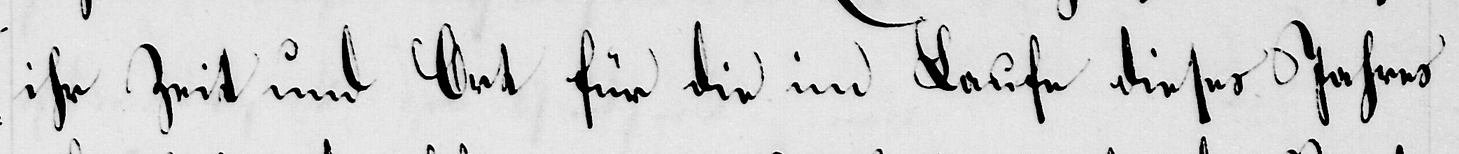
ihr Zeit und Ort für die im Laufe dieses Jahres
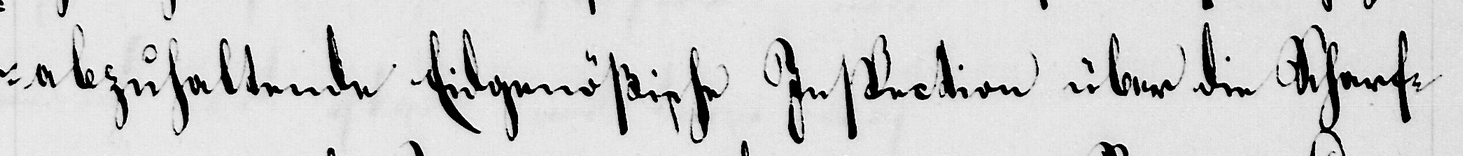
abzuhaltende Eidgenößische Inspection über die Scharf¬
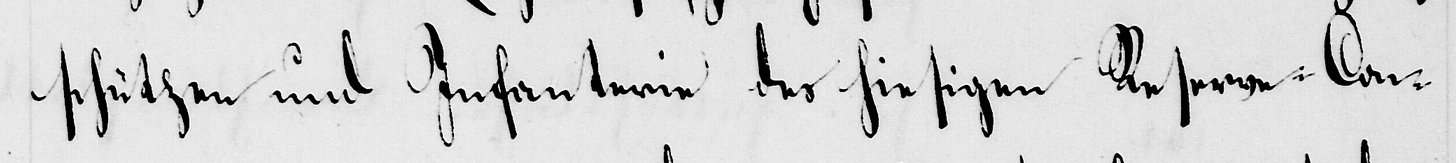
schützen und Infanterie des hiesigen Reserve-Con¬
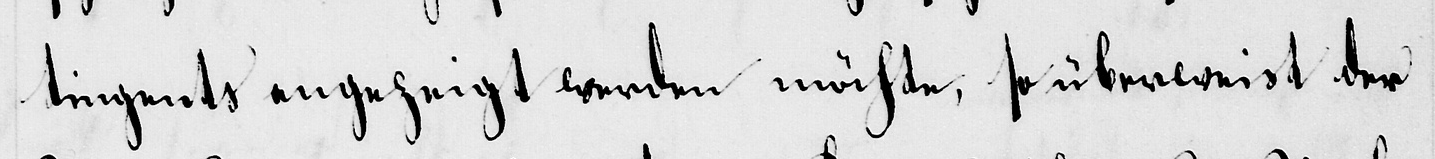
tingents angezeigt werden möchte, so überweist der
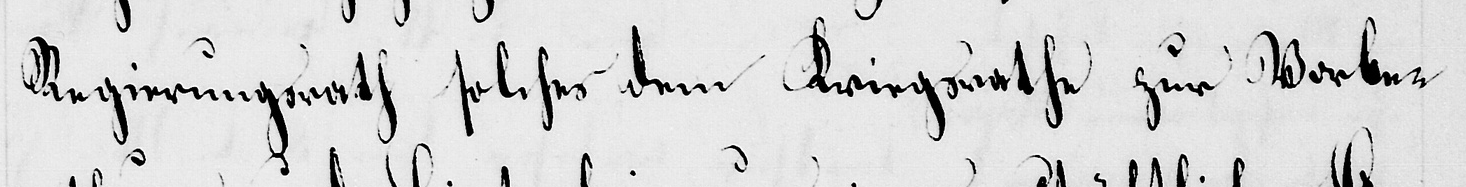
Regierungsrath solches dem Kriegsrathe zur Vorbe¬
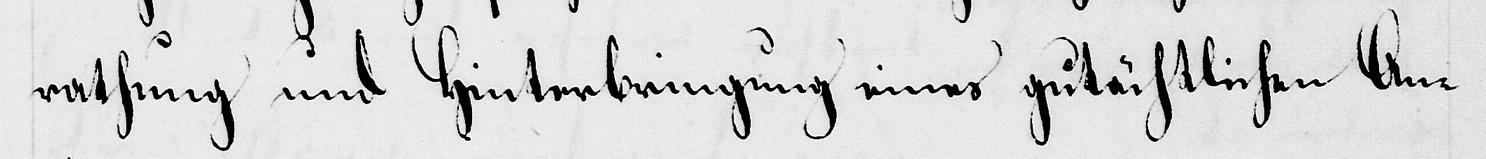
rathung und Hinterbringung eines gutächtlichen An¬
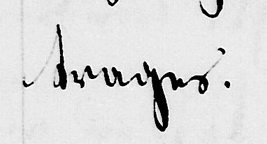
trages.
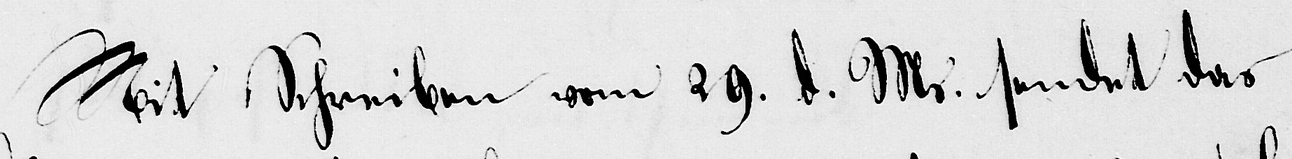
Mit Schreiben vom 29. d. Ms. sendet das
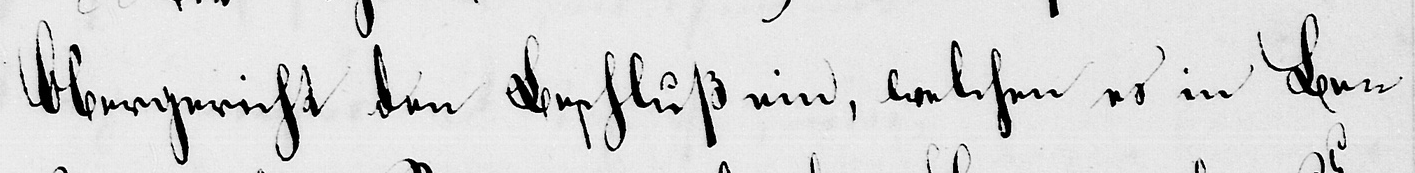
Obergericht den Beschluß ein, welchen es in Be¬
